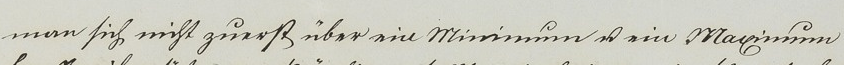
man sich nicht zuerst über ein Minimum & ein Maximum
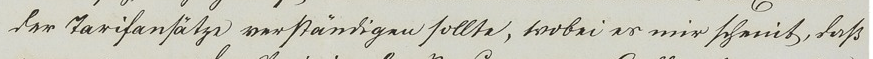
der Tarifansätze verständigen sollte, wobei es mir scheint, daß
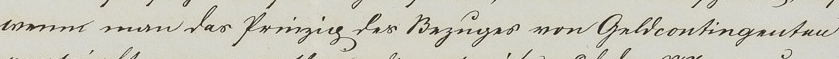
wenn man das Prinzip des Bezuges von Geldcontingenten
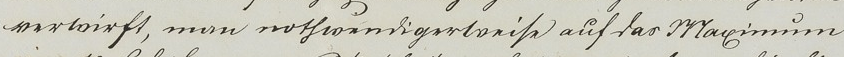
verwirft, man nothwendigerweise auf das Maximum
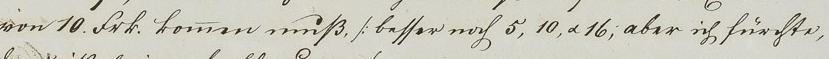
von 10. Frk. kommen muß, (besser noch 5, 10, & 16; aber ich fürchte,
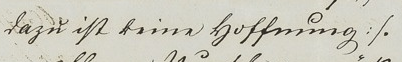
dazu ist keine Hoffnung).
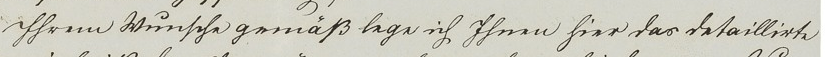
Ihrem Wunsche gemäß lege ich Ihnen hier das detaillirte
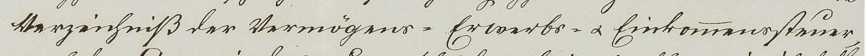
Verzeichniß der Vermögens- Erwerbs- & Einkommenssteuer,
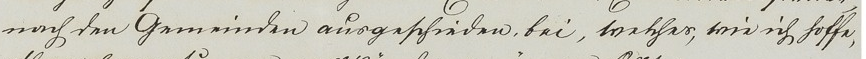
nach den Gemeinden ausgeschieden, bei, welches, wie ich hoffe,
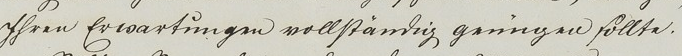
Ihren Erwartungen vollständig genügen sollte.
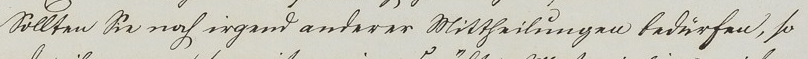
Sollten Sie noch irgend anderer Mittheilungen bedürfen, so
